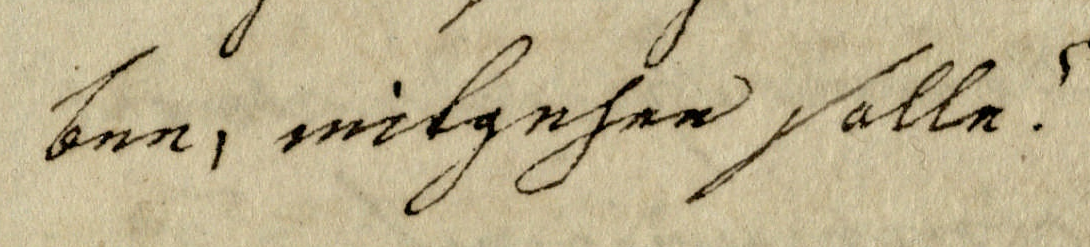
ben, mitgehen solle?
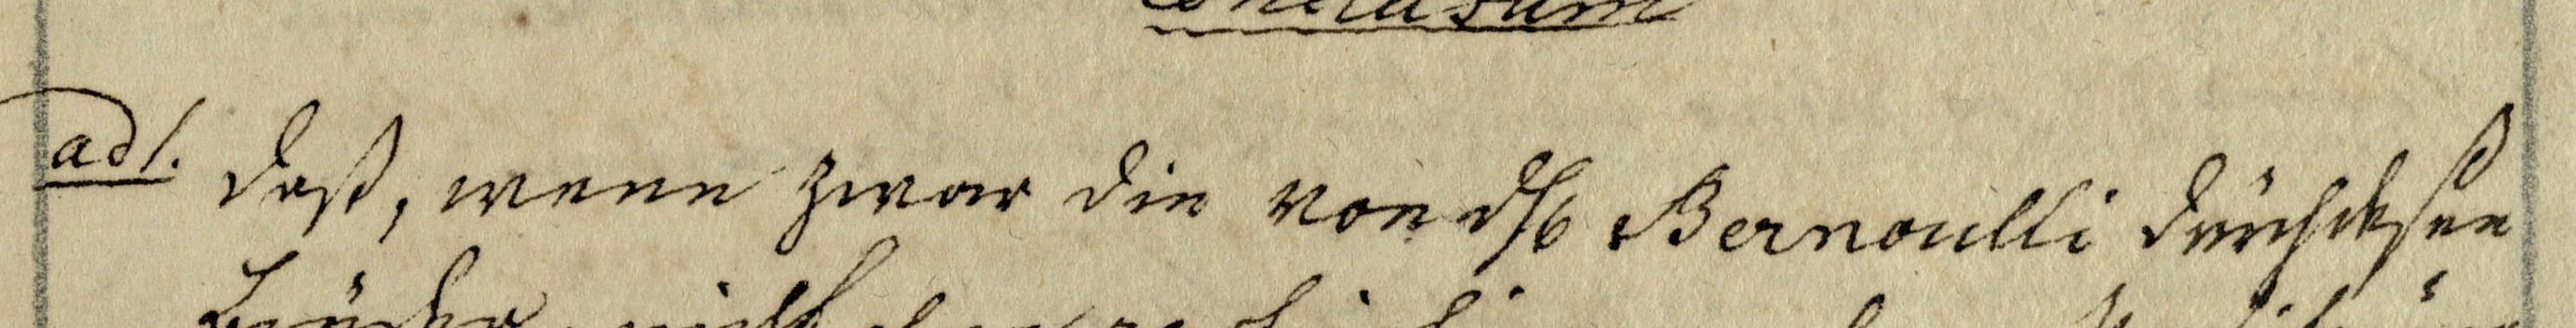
ad 1. daß, wenn zwar die von dh Bernoulli durch deßen
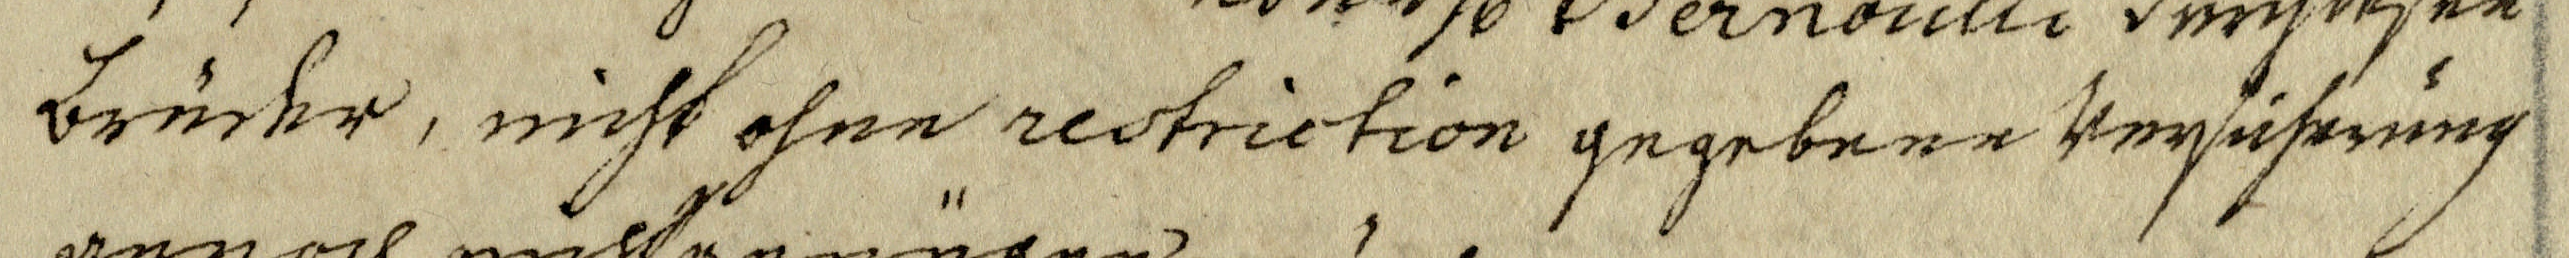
Bruder, nicht ohne restriction gegebene Versicherung
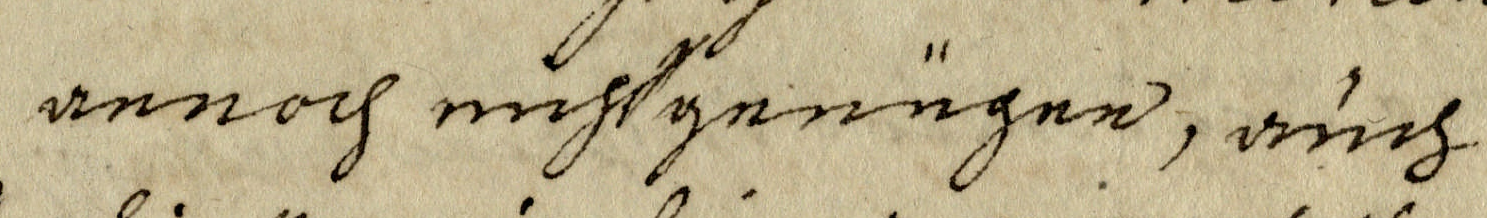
annoch nicht genügen, auch
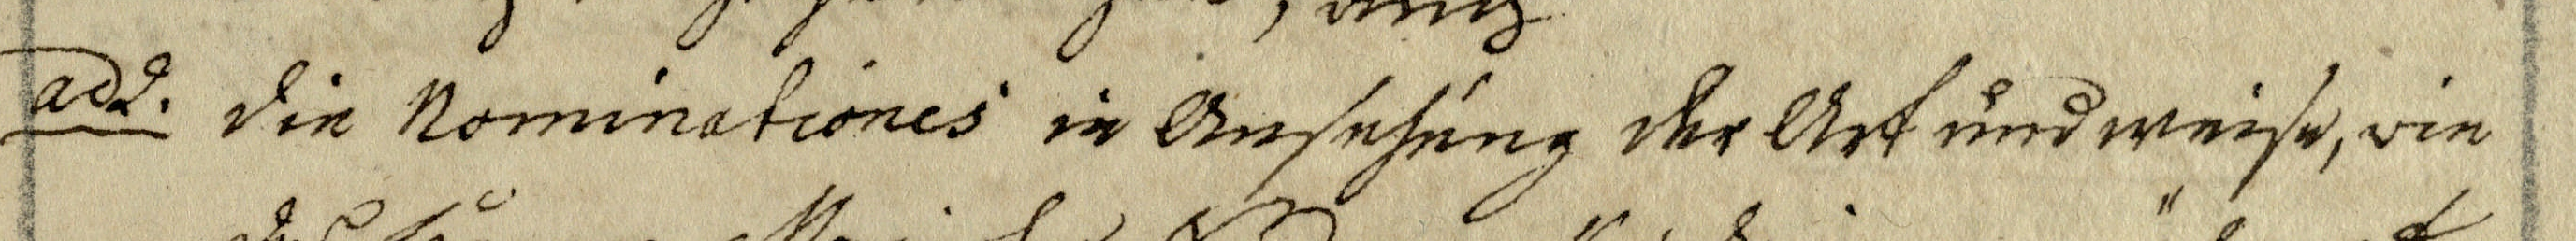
ad 2. die Nominationes in Ansehung der Art und weise, wie
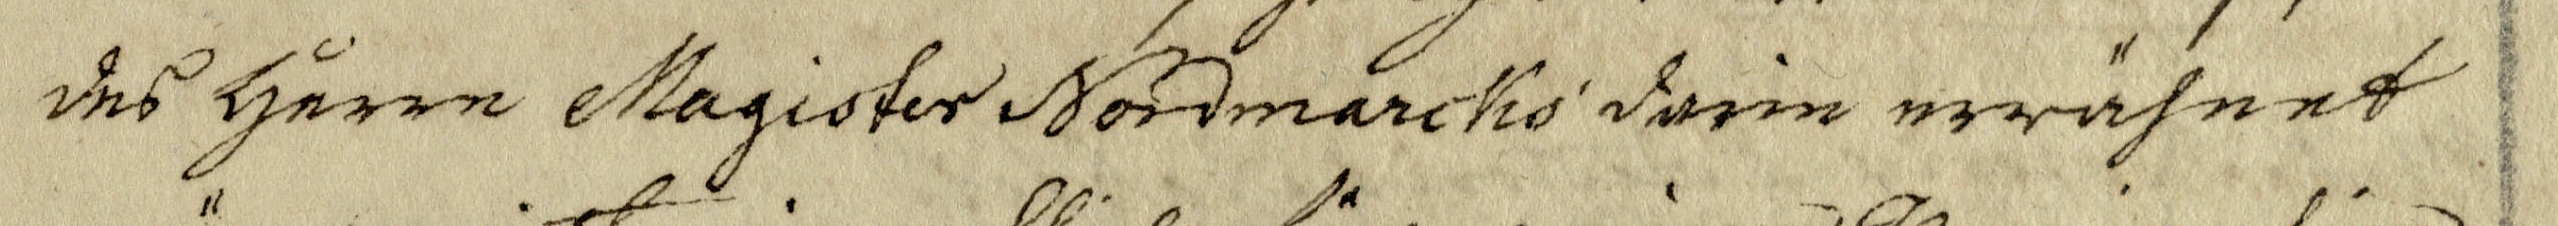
des Herrn Magister Nordmarcks darin erwähnet
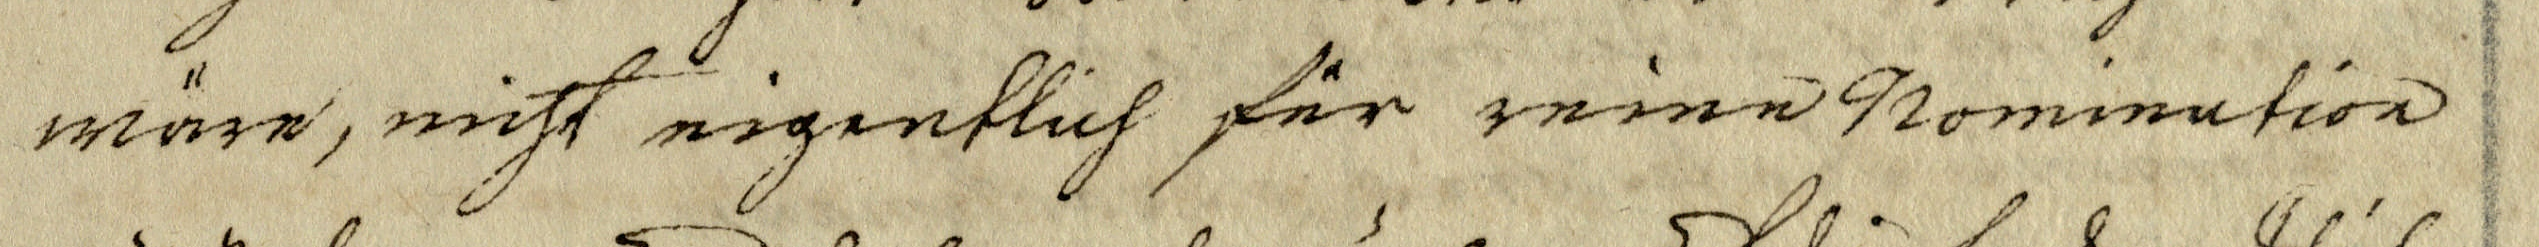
wäre, nicht eigentlich für reine Nomination
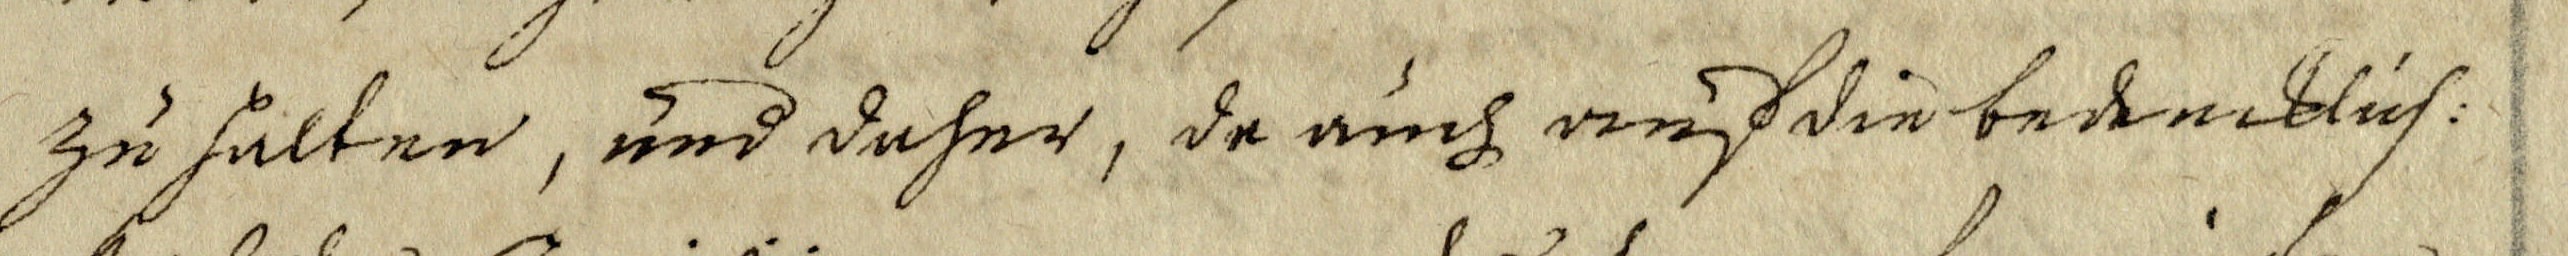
zu halten, und daher, da auch auf die Bedenklich¬
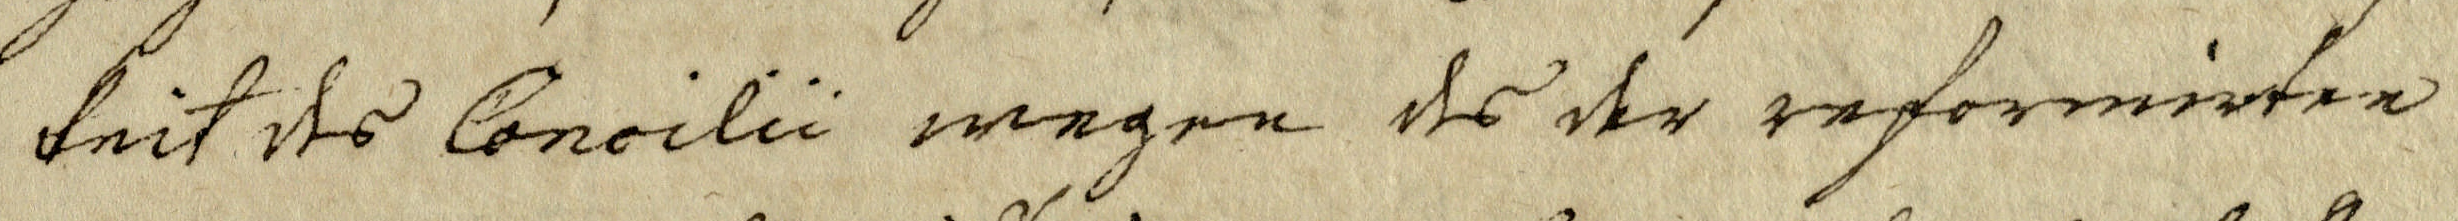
keitt des Concilii wegen des der reformirten
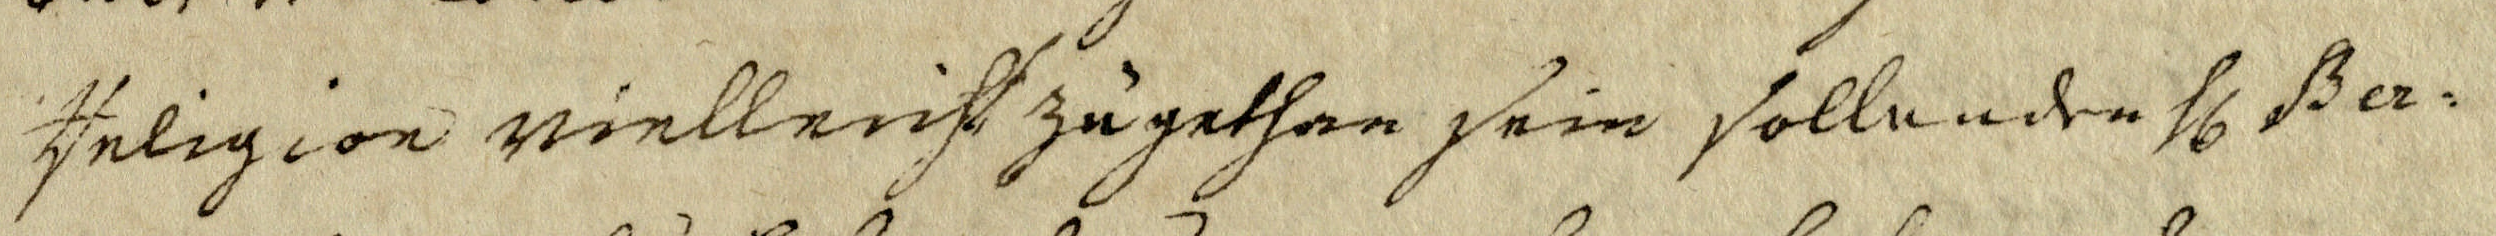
Religion vielleicht zugethan sein sollenden h. Ber¬
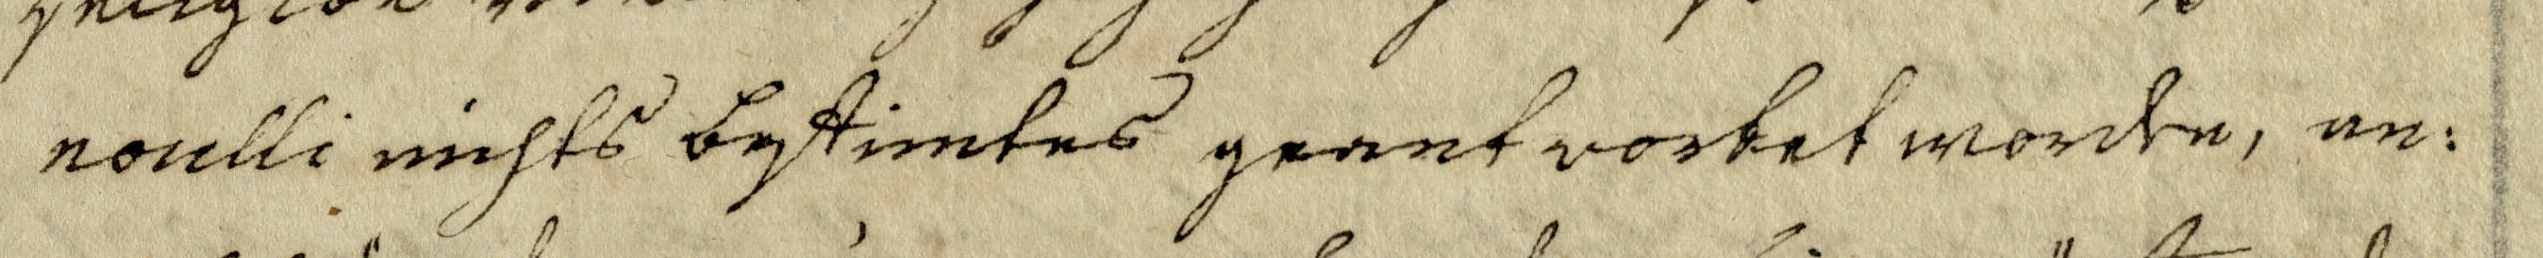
noulli nichts bestimtes geantwortet worden, an¬
